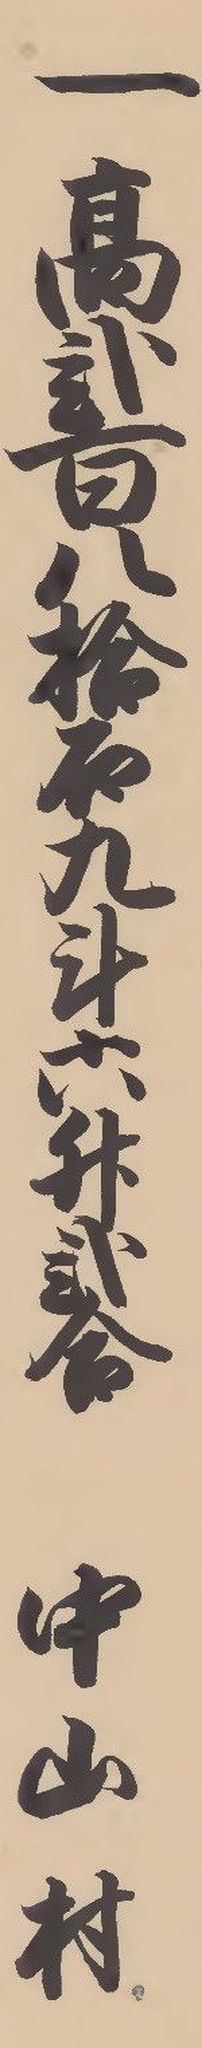一高弐百八拾石九斗六升弐合中山村
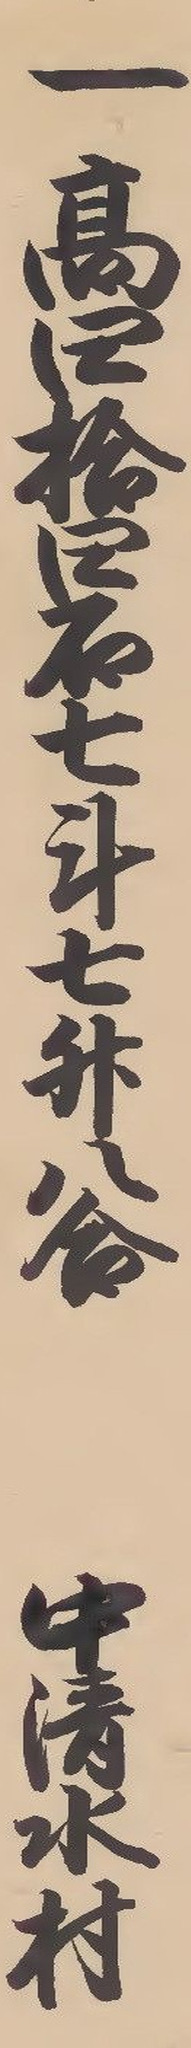一高四拾四石七斗七升八合中清水村
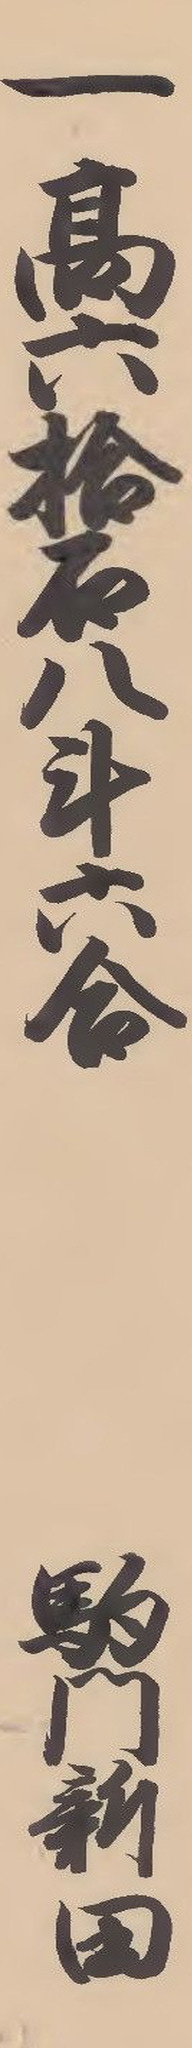一高六拾石八斗六合駒門新田
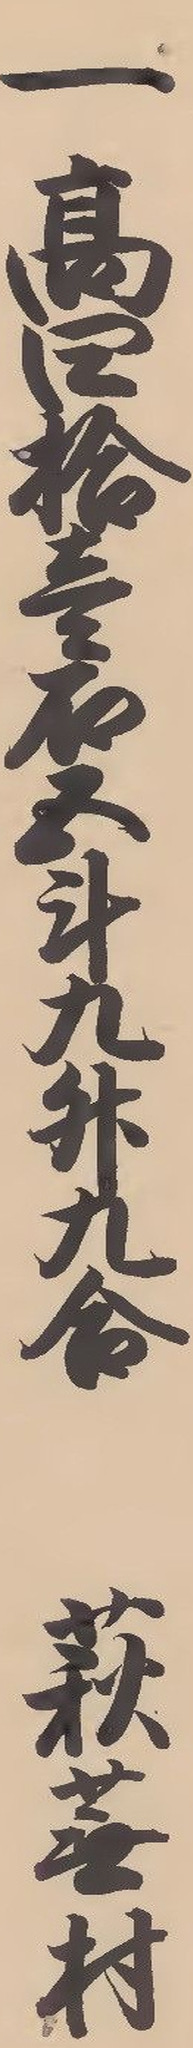一高四拾壱石五斗九升九合萩蕪村
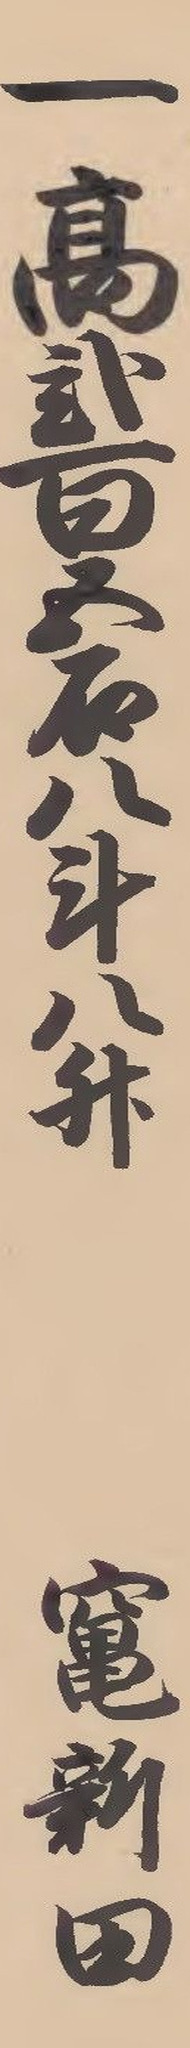一高弐百五石八斗八升竃新田
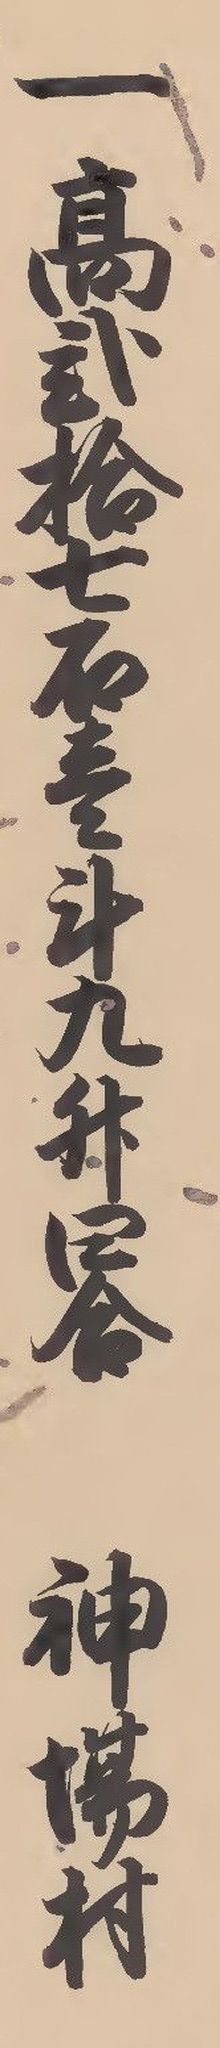一高弐拾七石壱斗九升四合神場村

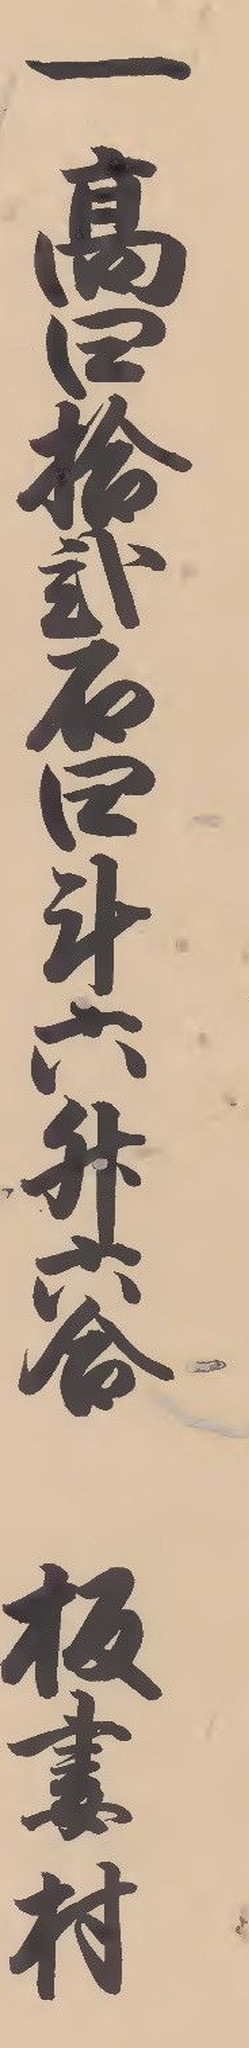一高四拾弐石四斗六升六合板妻村
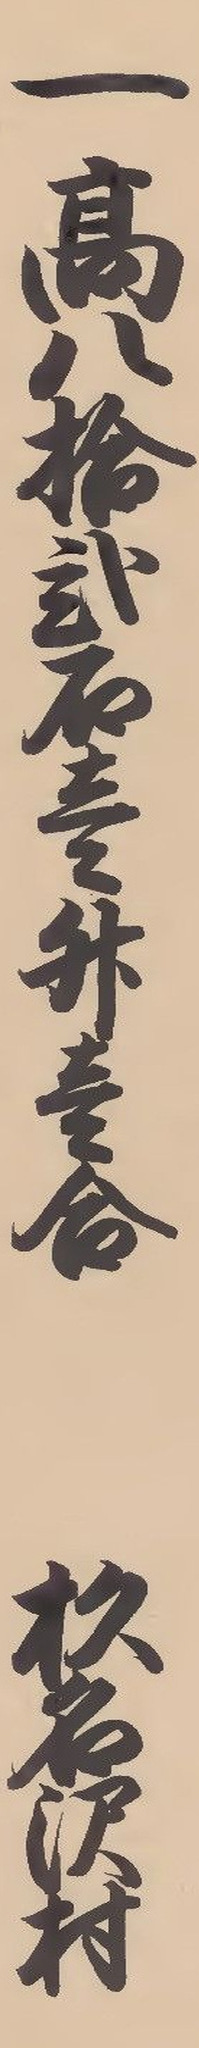一高八拾弐石壱升壱合杉名沢村
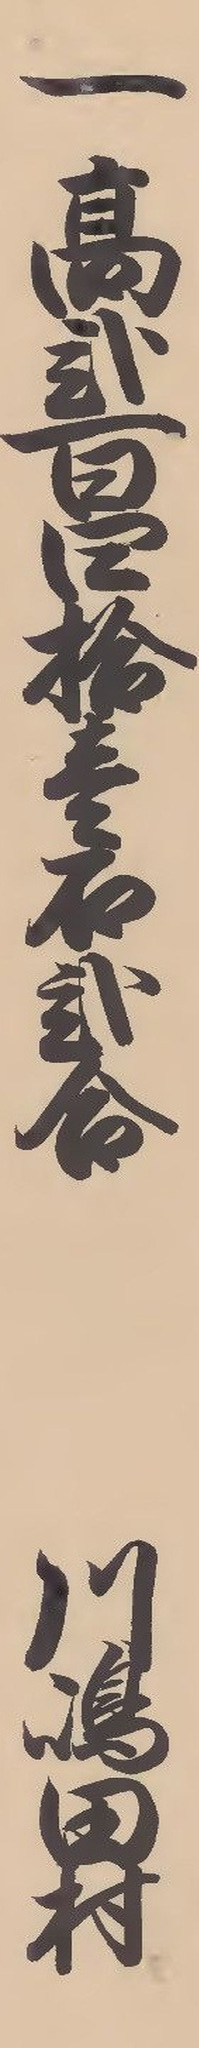一高弐百四拾壱石弐合川島田村
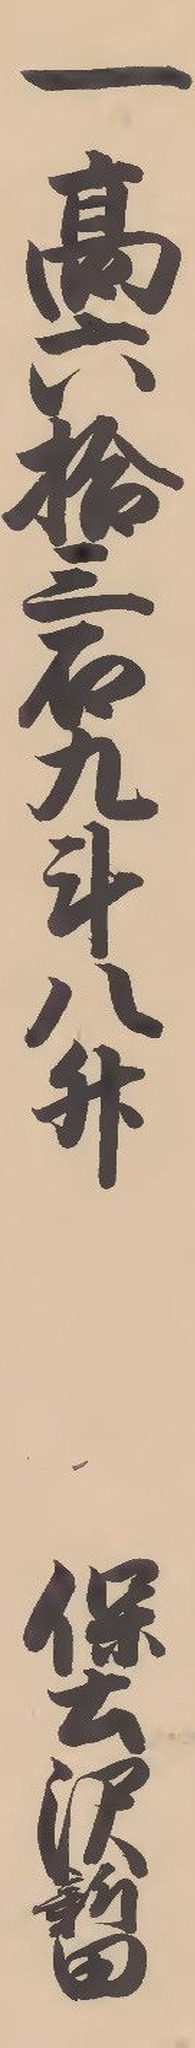一高六拾三石九斗八升保土沢新田
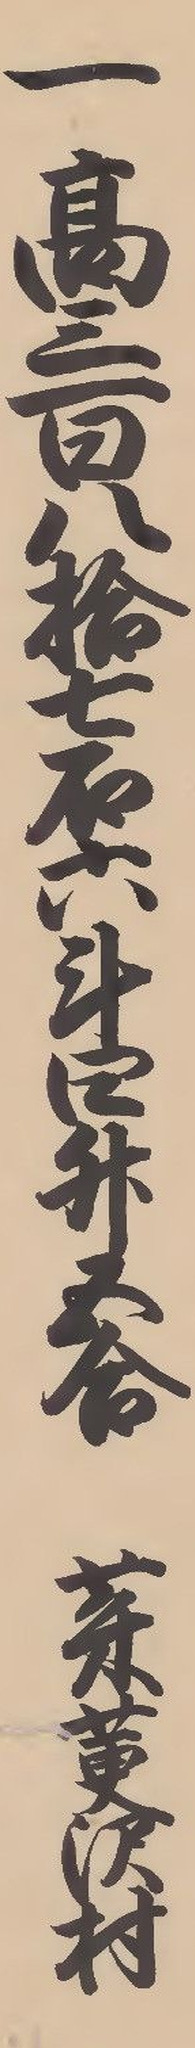一高三百八拾七石六斗四升五合茱萸沢村
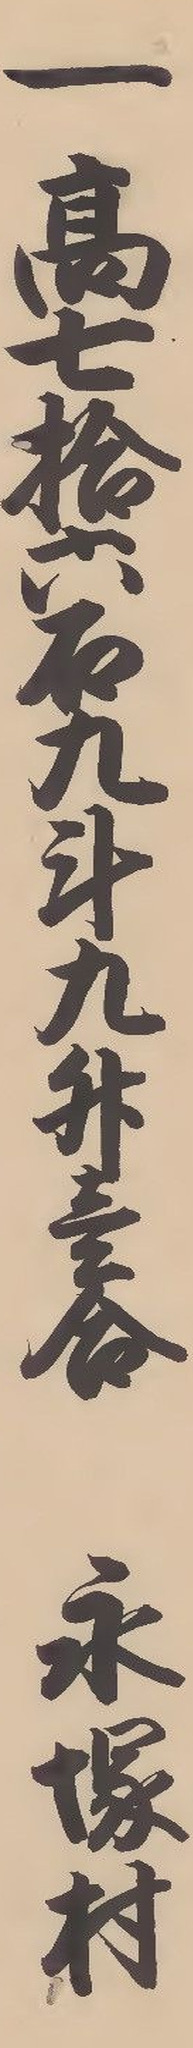一高七拾六石九斗九升壱合永塚村
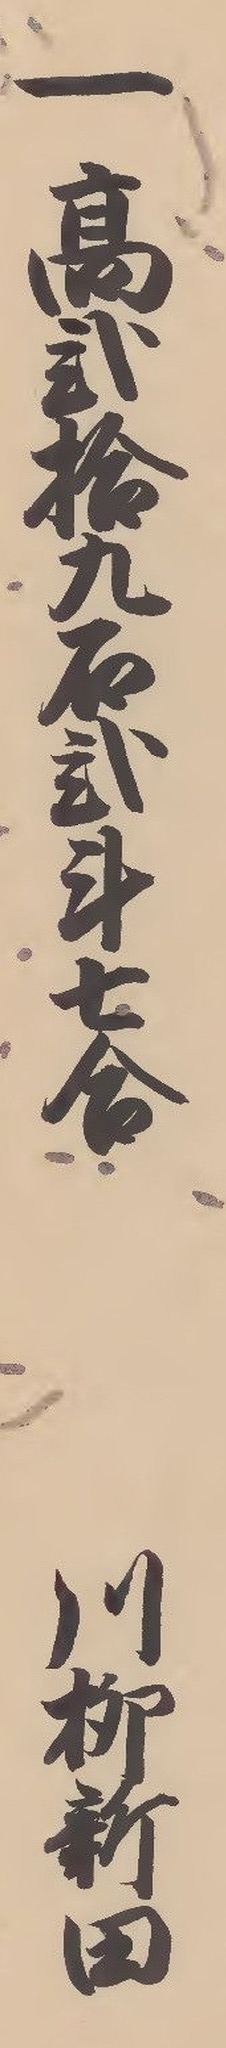一高弐拾九石弐斗七合川柳新田

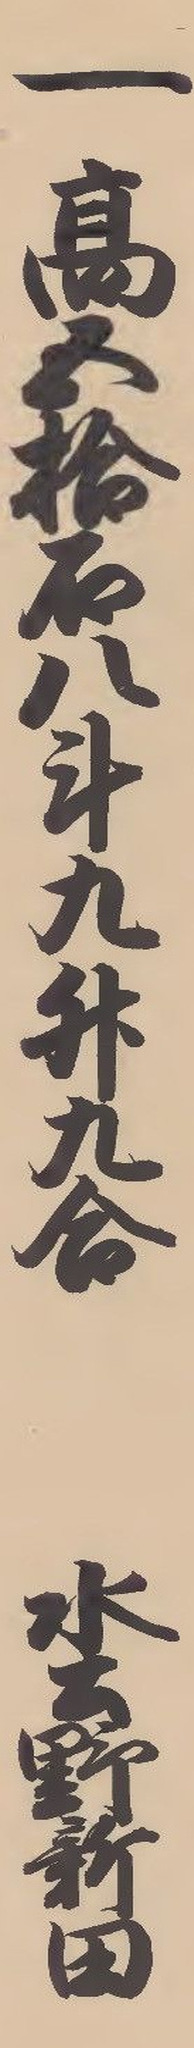一高五拾石八斗九升九合水土野新田
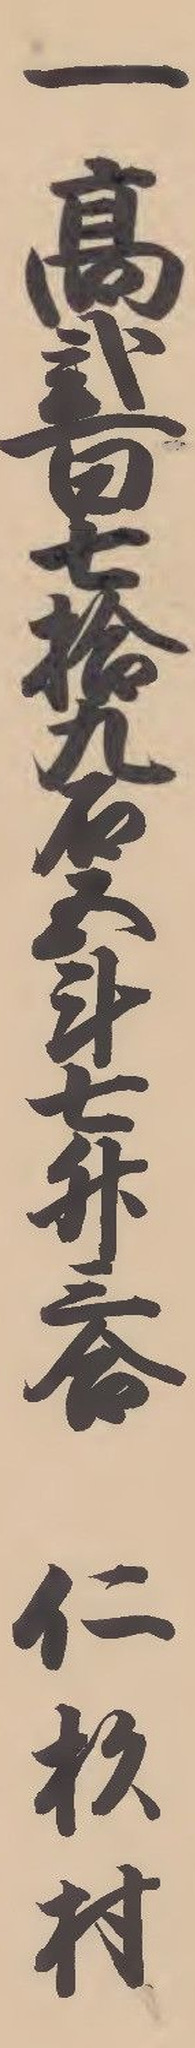一高弐百七拾九石五斗七升三合仁杉村
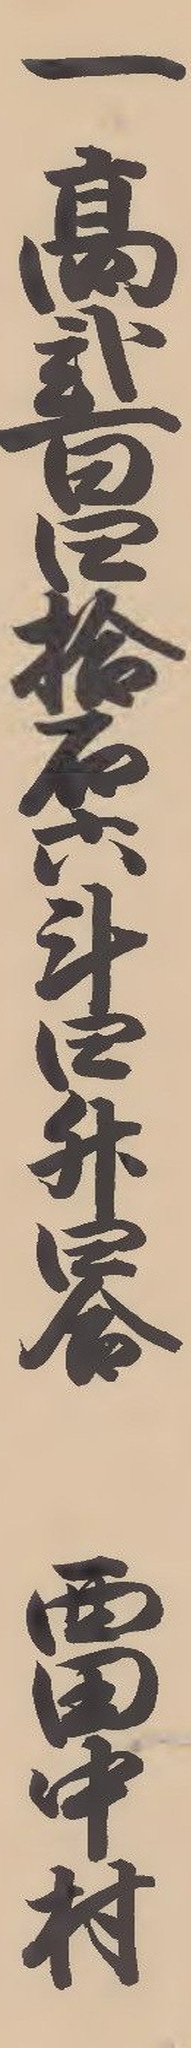一高弐百四拾石六斗四升四合西田中村
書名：駿河国郷帳
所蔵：国立公文書館 National Archives of Japan
